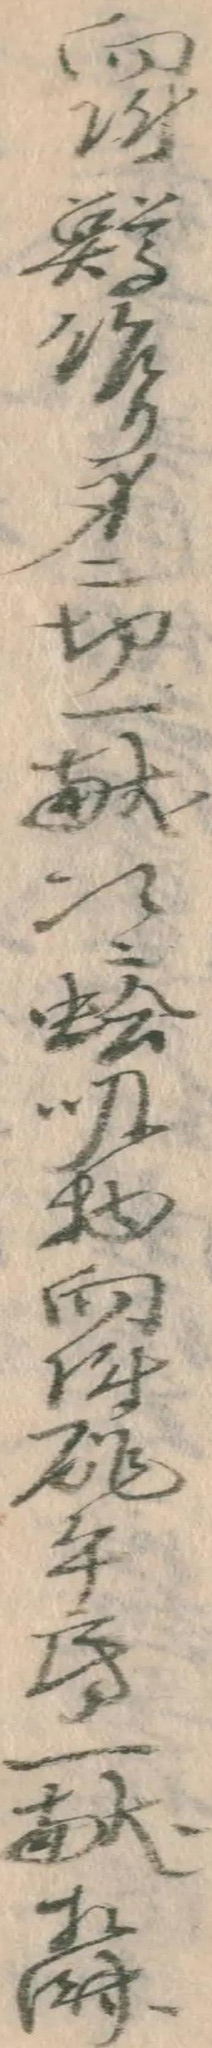向附鱒作り身二切一献次に蛤吸物向附砕午房一献相済
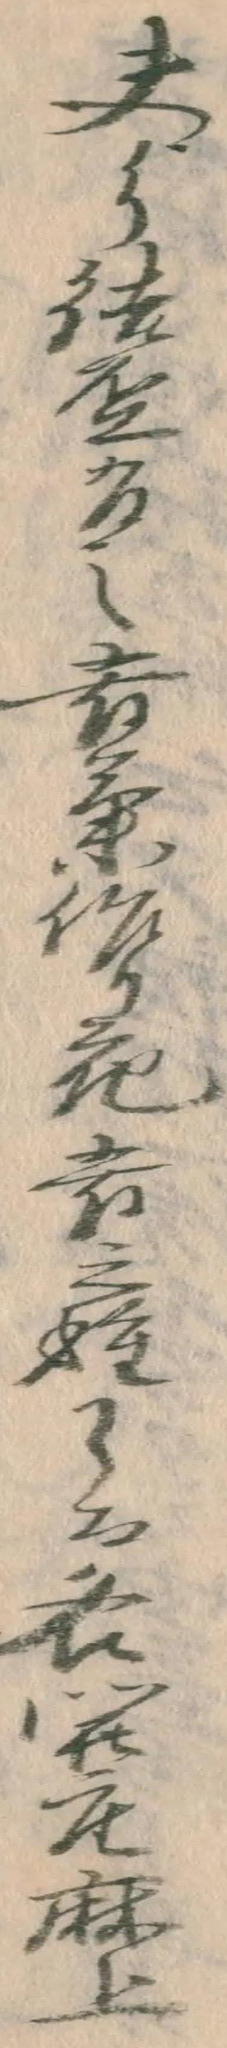夫より結盃有之肴菊作り花肴三種了而各開座麻上
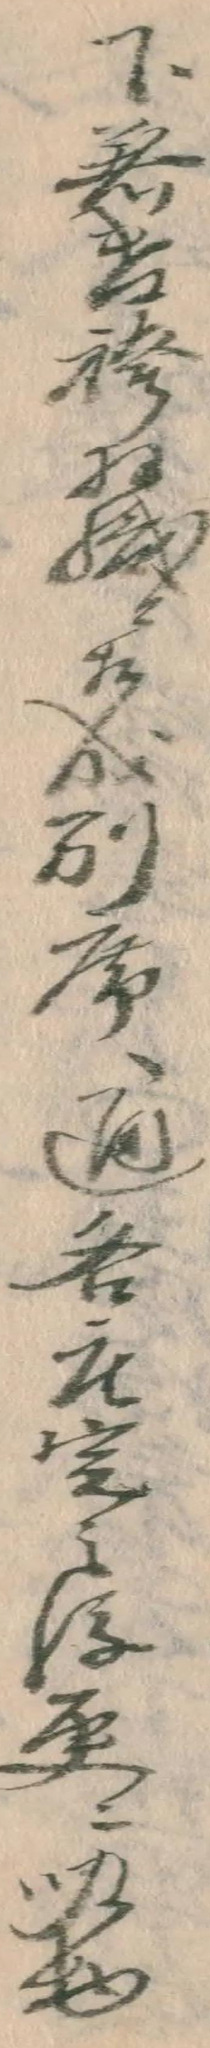下着袴羽織ニ相成別席へ通各座定之後更に吸物
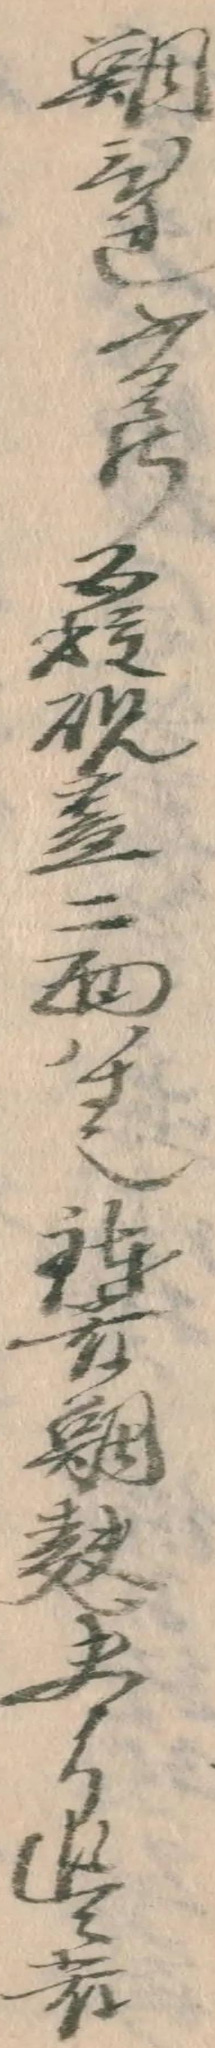鯛ひれふけの五種硯蓋二面八寸也鉢肴鯛麩夫より追々肴
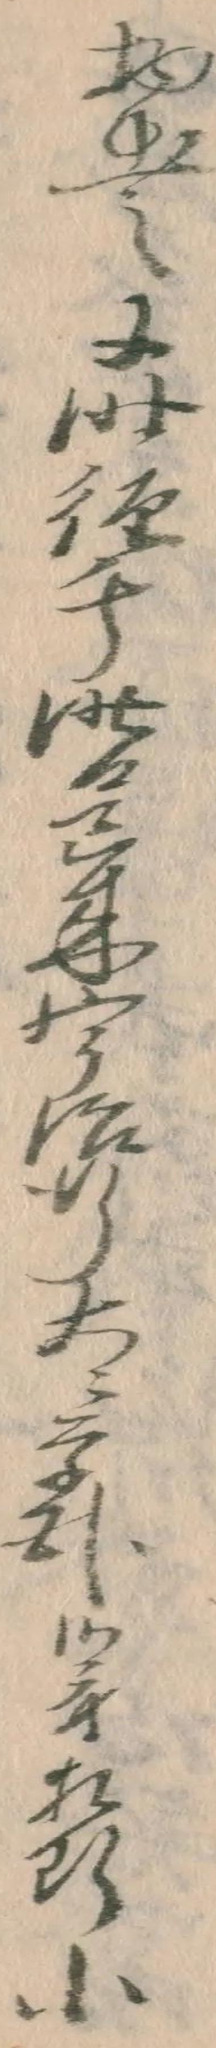物出之于時経千昨日已来宇治行大ニ草臥候ニ付相断小
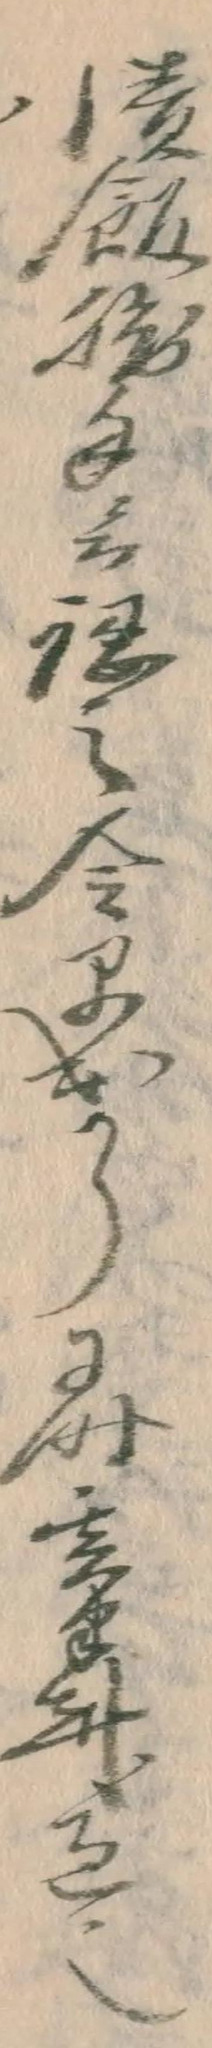漬飯勝手ニ而認之令早出了于時亥半刻過也
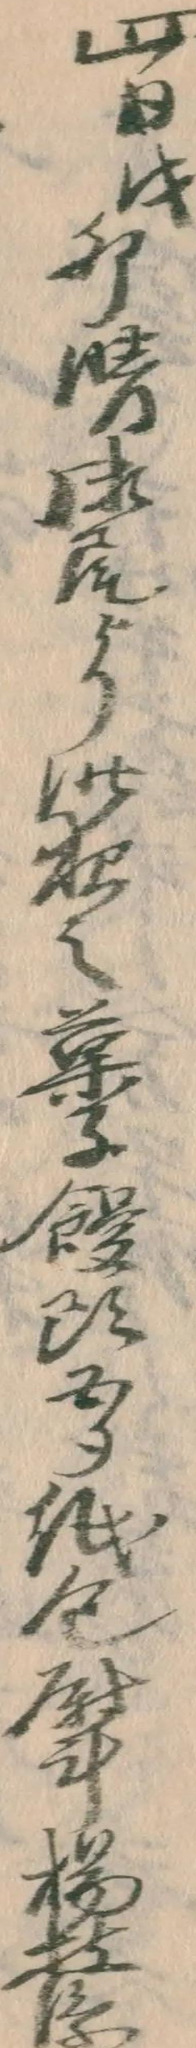四日戊卯晴瀬尾より昨夜之菓子饅頭五ツ紙包熨斗揚枝添
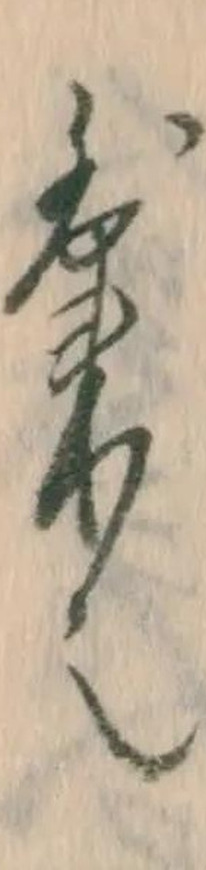到来也
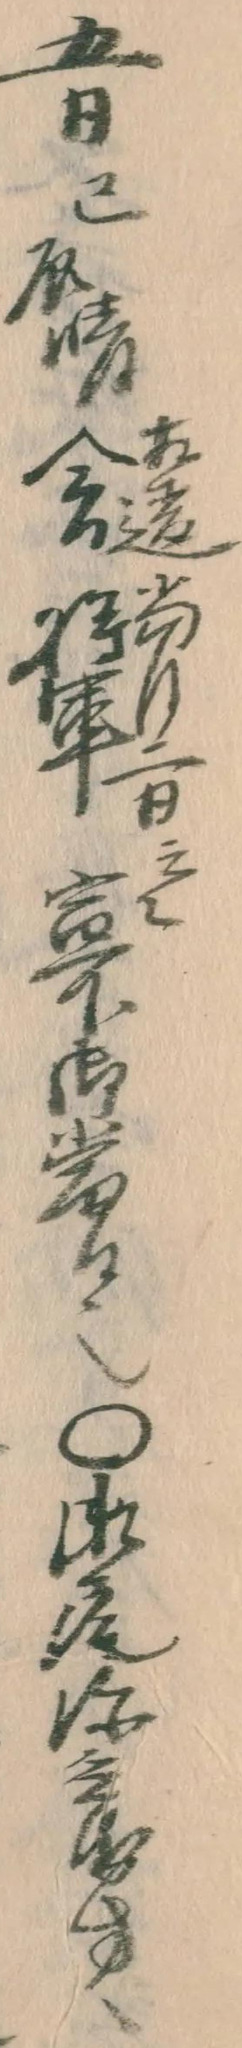五日己辰晴今日将軍宣下御當日也○瀬尾弥兵衛方へ
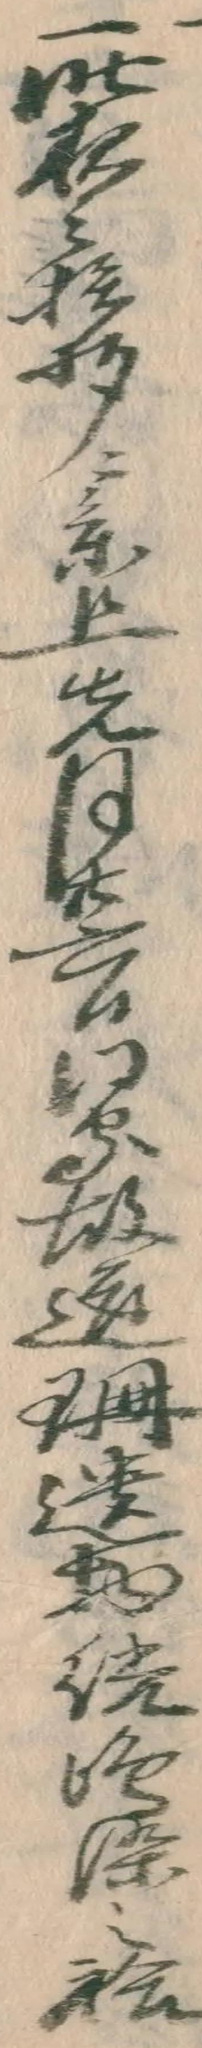一昨夜之挨拶ニ参上先月廿六日同家故道珊遺物絖番染之袷
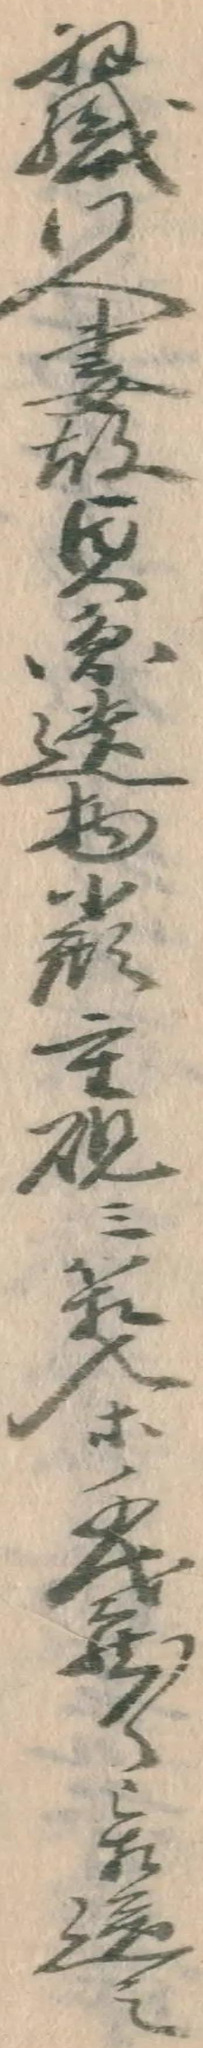羽織同人妻故貞國遺物小形重硯三箱入等千代蔵ヘ被相送之
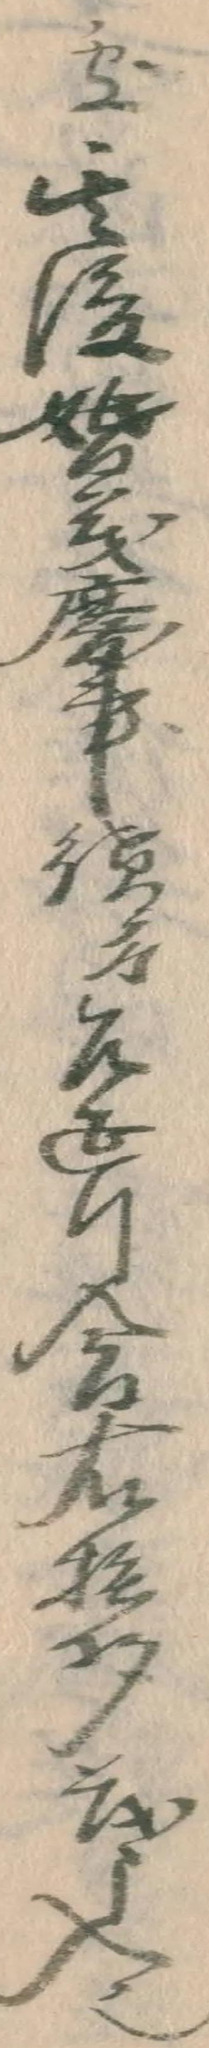處其後婚儀慶事續ニ付乍延引今日右挨拶も申入也
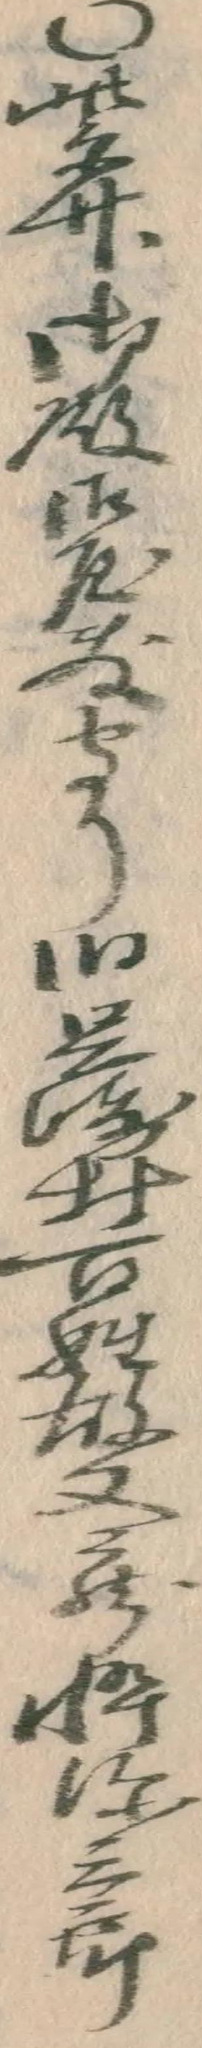○紫竹御殿御屋敷守り旧岡崎村百姓故又蔵忰弥三郎
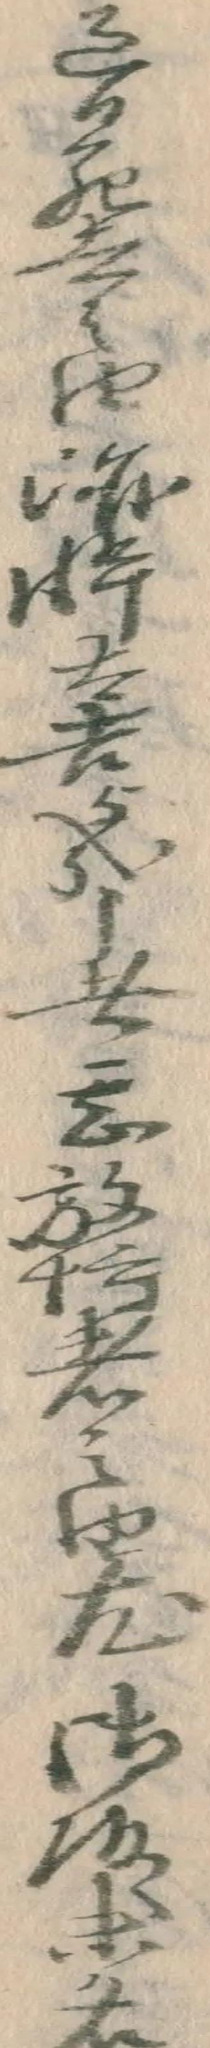過日死去之由跡忰太吉と哉申者甚放埒者之由尤御坂ヘ未名
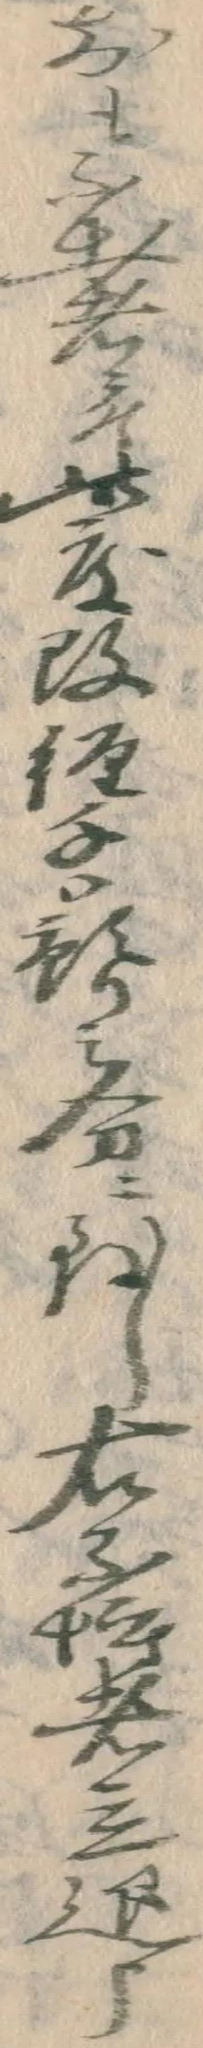前も不出者ニ付此度改経千御預り之分ニ致し右不埒者立退申
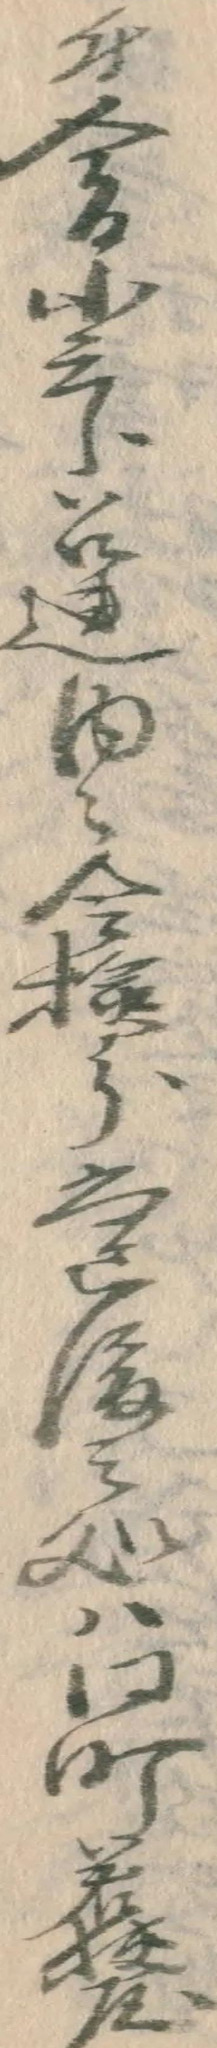付今日小兵衛召連内々令検分尚已後之処ハ同町若狭屋
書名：賀茂社記録. 第67冊
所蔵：国立国会図書館 National Diet Library, JAPAN
